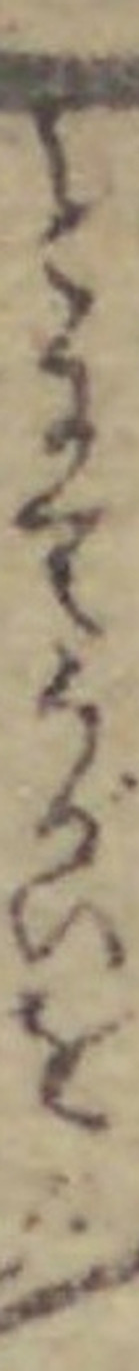とにてうがいを
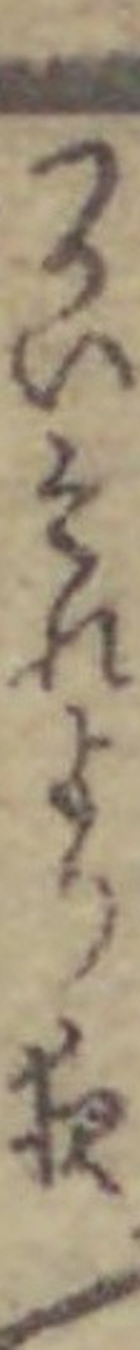つかいそれより夜
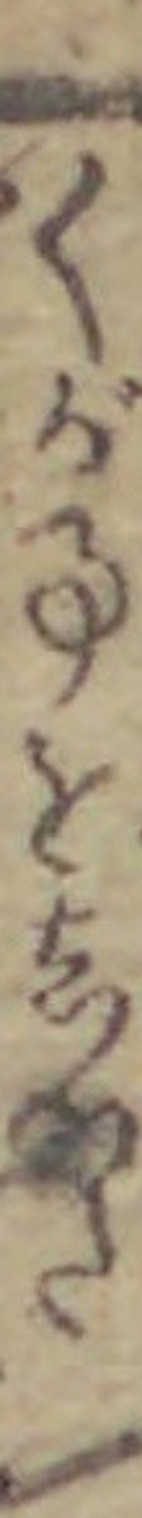〳〵が事をしつた
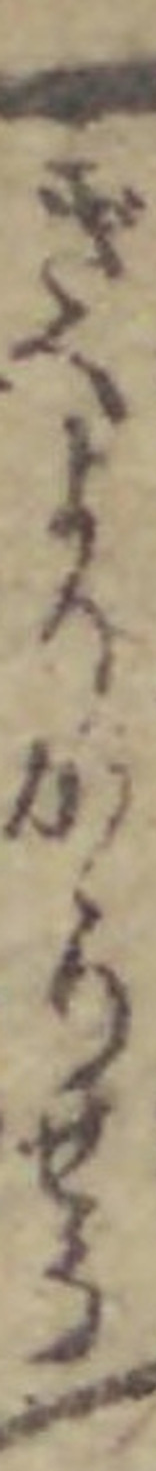ぎへよりかゝりせう
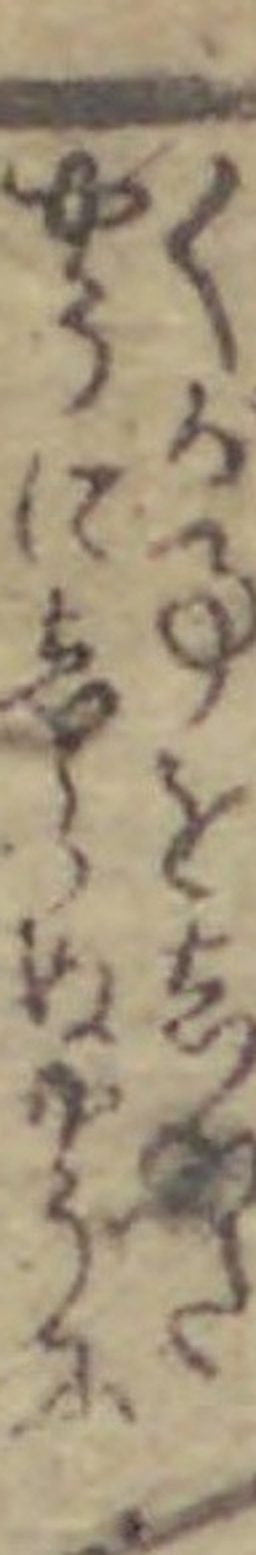やうにしらぬやうに
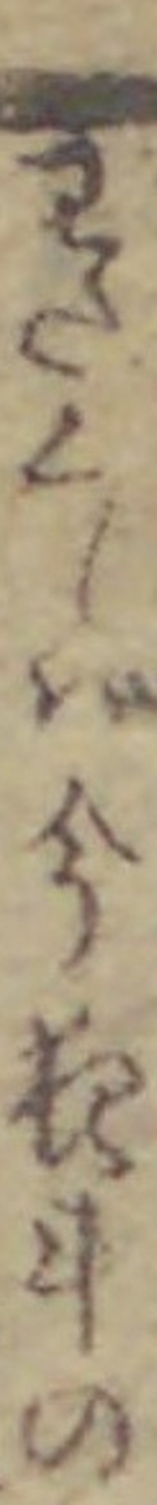わたくしは今夜計の
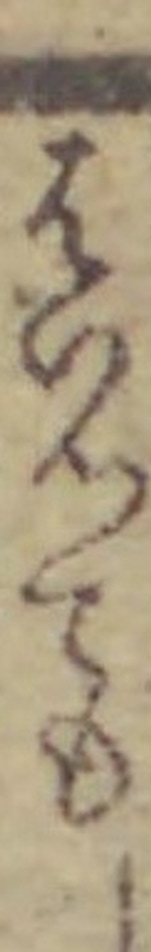はいつても
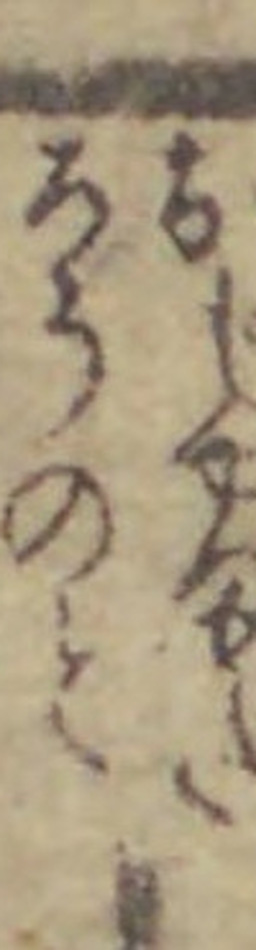ろうのと
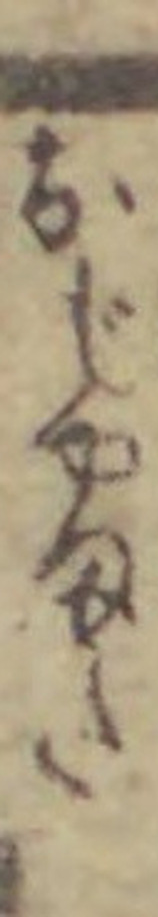おじやまた
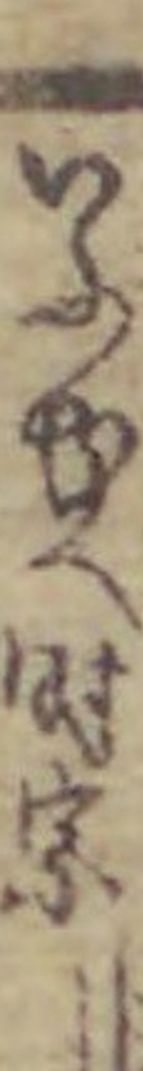いふゆへ時宗
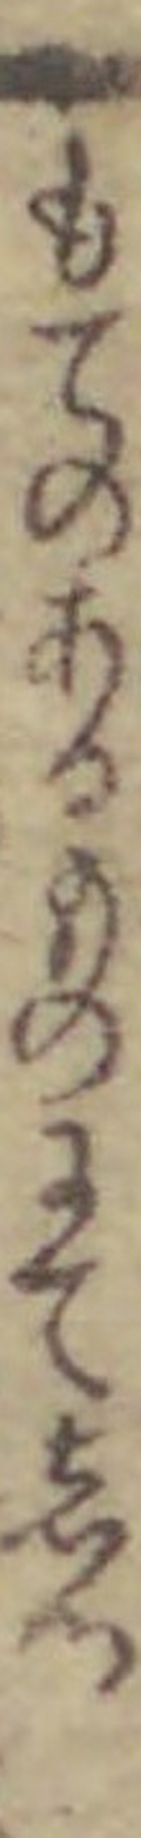もてのあるものにてしつ
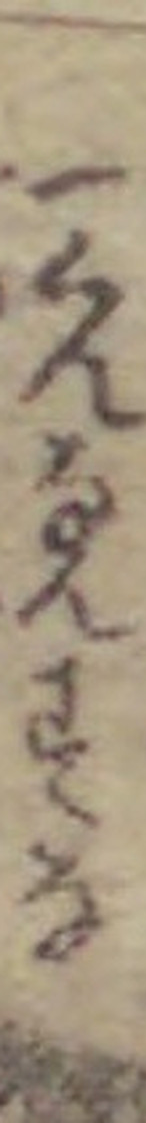くんなんすな
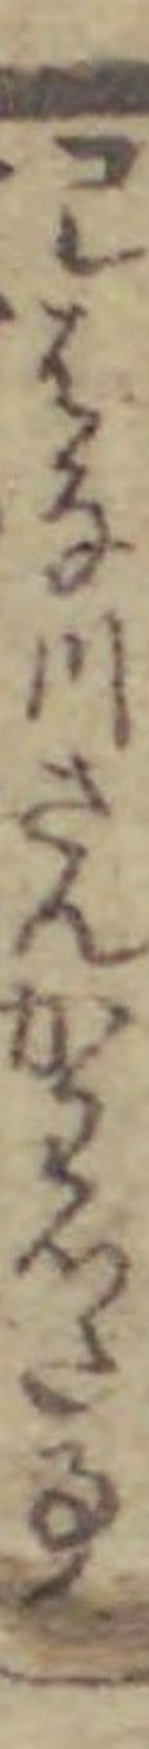コレはな川さんかわつた事
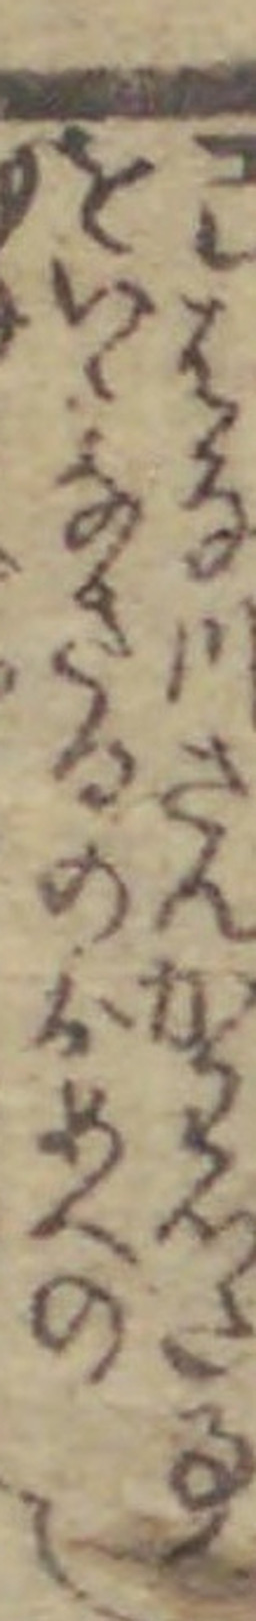をいゝなさるのおめへの
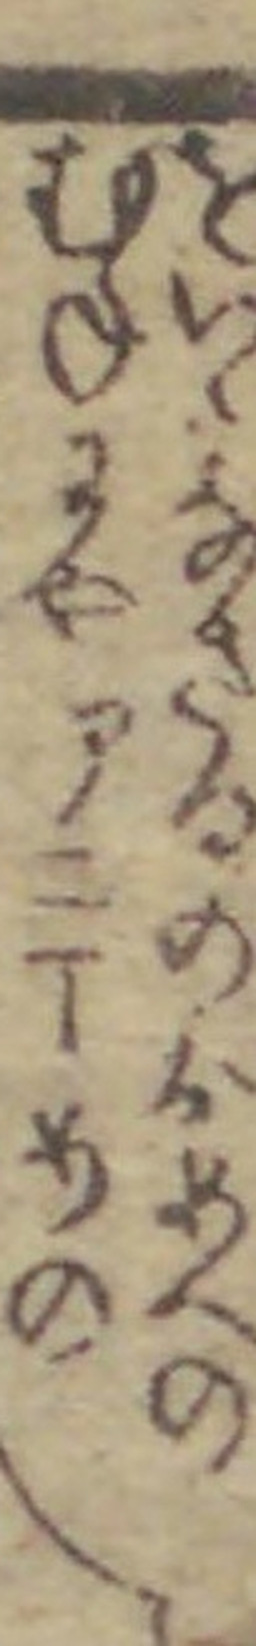むねにやア二丁めの
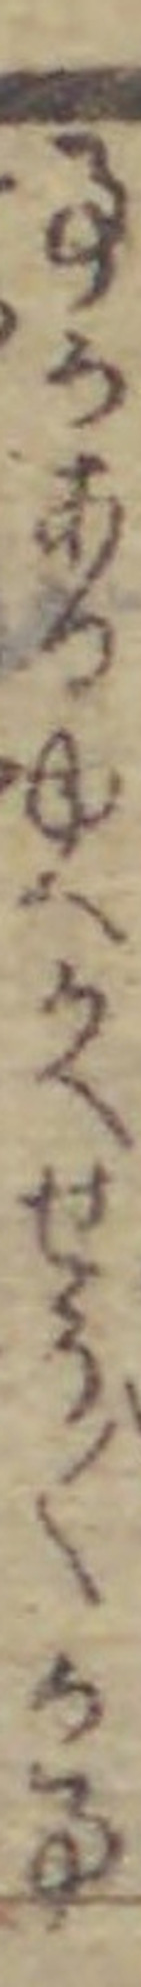事かあるゆへかへせう〳〵か事
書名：間似合嘘言曽我 3巻
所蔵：国立国会図書館 National Diet Library, JAPAN
